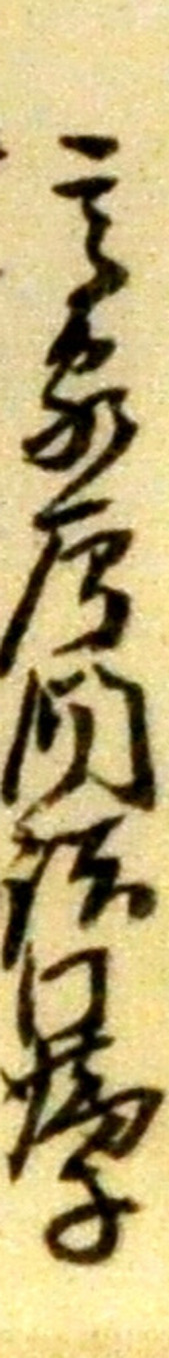高家鳫間詰同嫡子
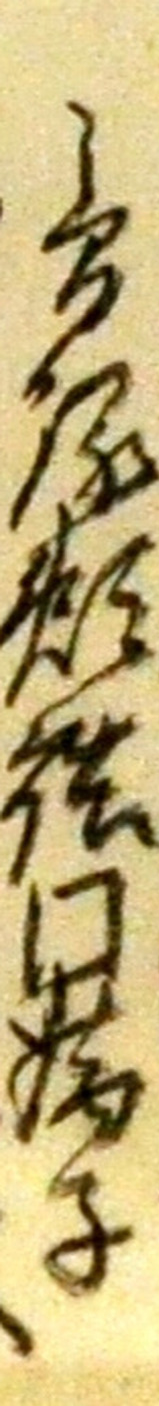之間縁頬詰同嫡子
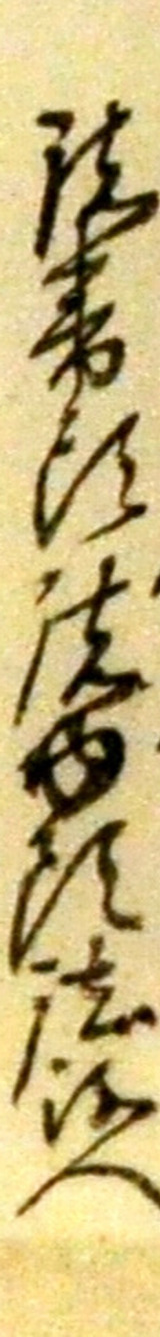諸番頭諸物頭諸役人
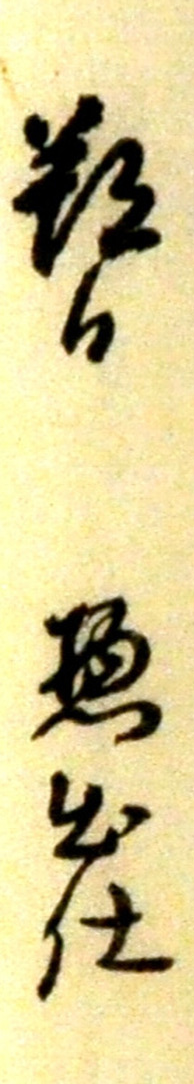朔日惣出仕

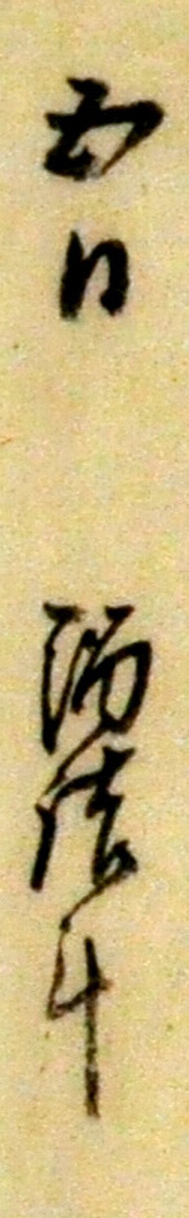五日溜詰計
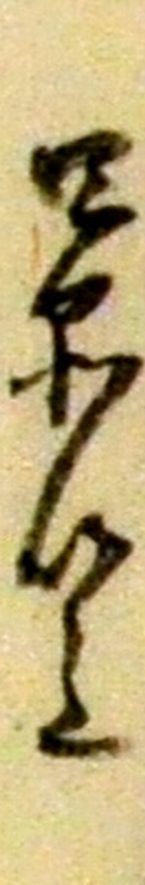四品以上
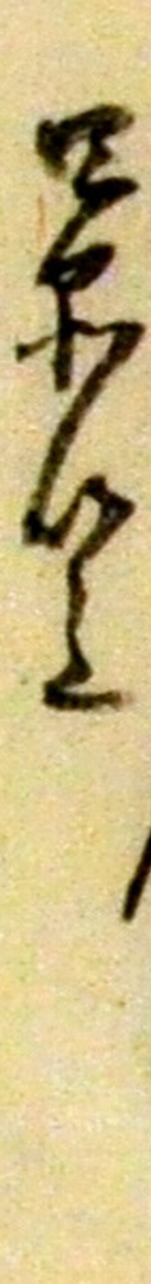四品以上
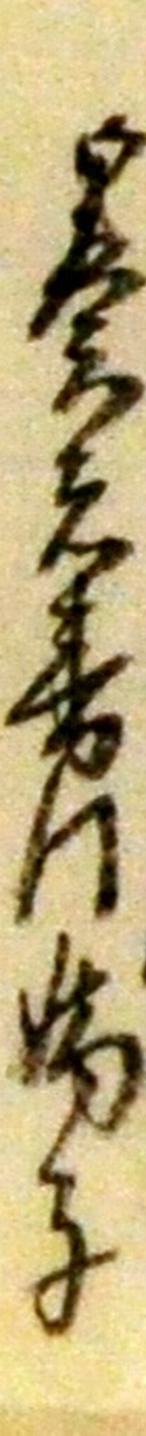九日奏者番同嫡子
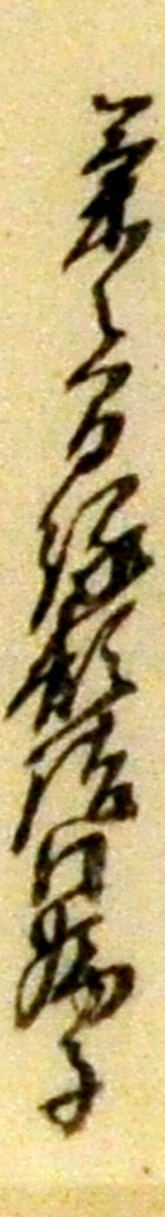菊之間縁頬詰同嫡子
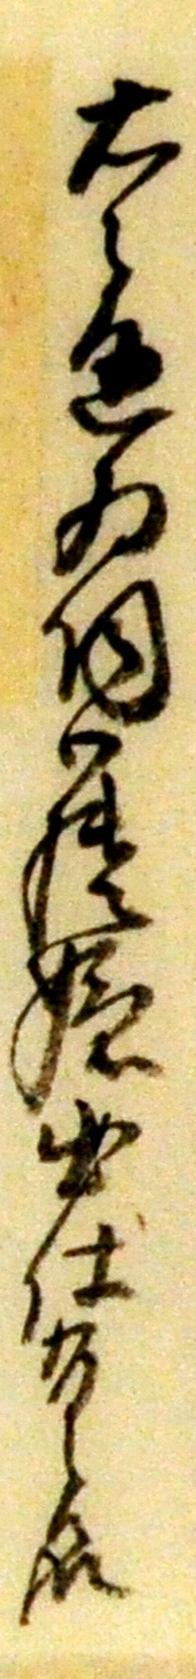右之通為伺御機嫌出仕有之候処
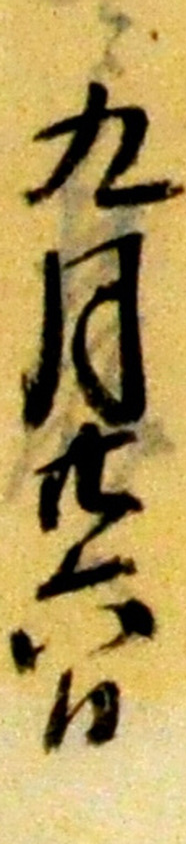九月廿六日
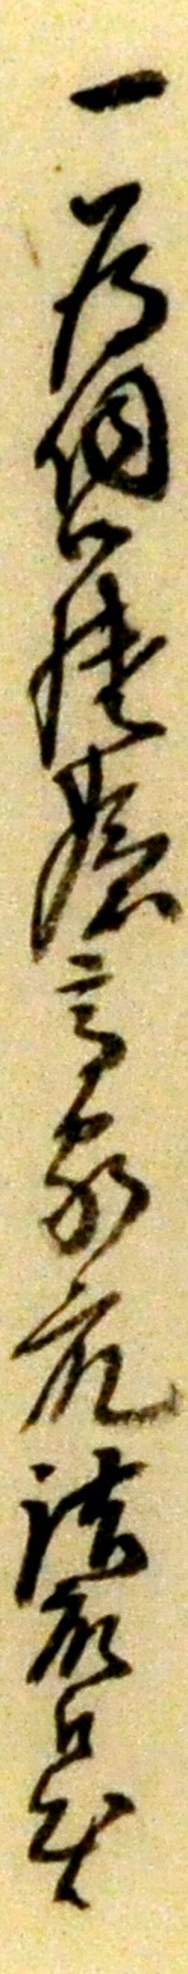一為伺御機嫌高家衆詰衆候出ス
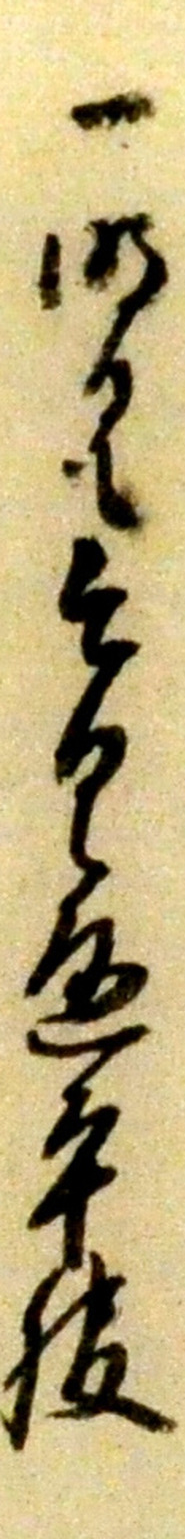一明日も今日之通平服
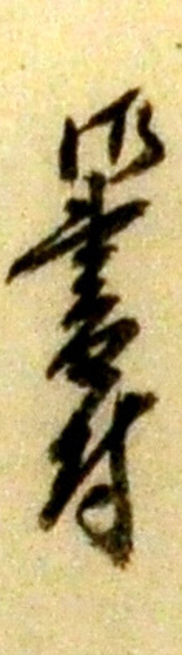御書付
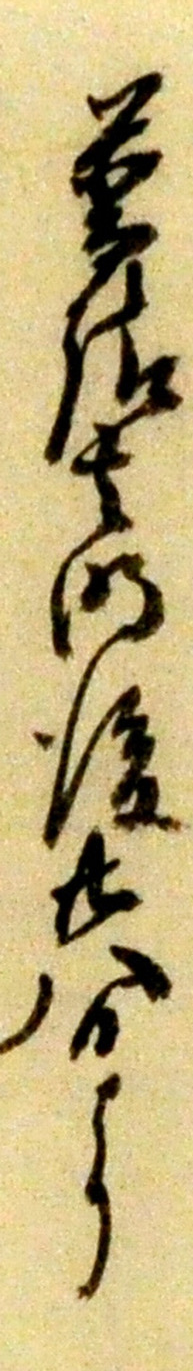普請者明後廿八日より
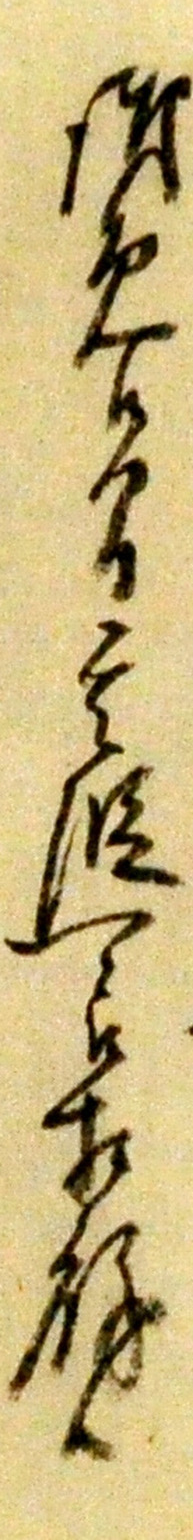御免候間其段可被相存候
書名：書抜
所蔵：伊那市立高遠町図書館・合同会社AMANE
